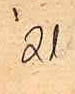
21
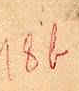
18b.
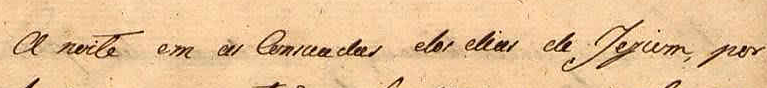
A noite em as Consuadas dos dias de Jejum, per
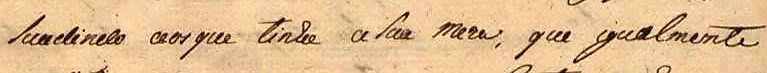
suadindo aos que tinha a sua meza, que igualmente
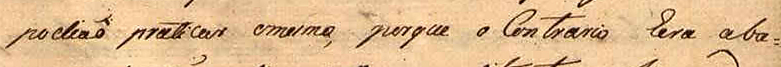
podiaõ praticar o mesmo, porque o Contrario hera abu
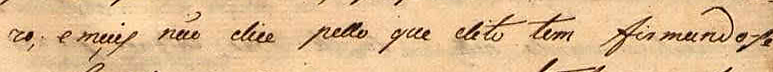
zo, e mais naõ dice pello que dito tem firmandose
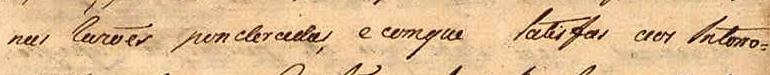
nas Razões ponderadas, e com que satisfas aos Intorro
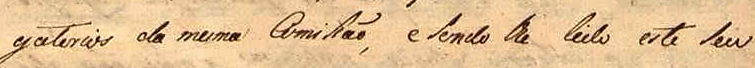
gatorios da mesma Comissaõ, e sendo lhe lido este seu
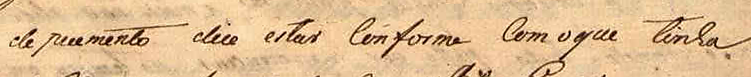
depuemento dice estar Conforme Com o que tinha
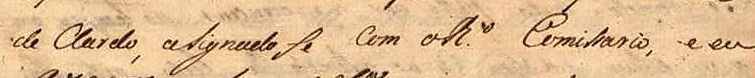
deClardo, asignado se com o R.o Comissario, e eu
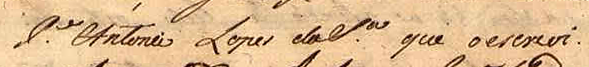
P.e Antonio Lopes da S.a que o escrevi.
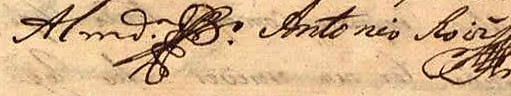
Almd.a Antonio Roiz̄
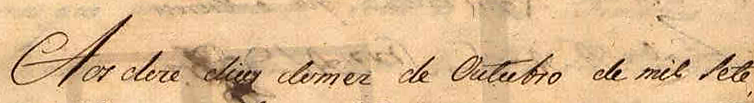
Aos doze dias do mez de Outubro de mil sete
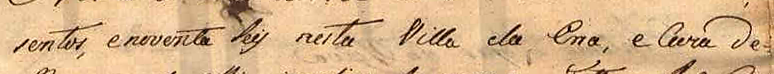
sentos, e noventa seis nesta Villa da Erra, e Caza de
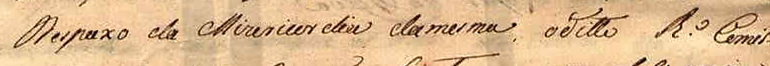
Despaxo da Mizericordia da mesma o ditto R.o Comis
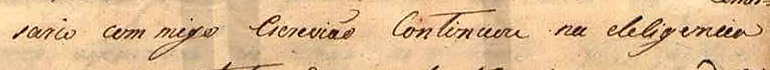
sario commigo Escreviaõ Continuou na deligencia
